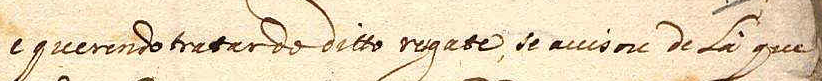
e querendo tratar do ditto resgate, se auisou de Là que
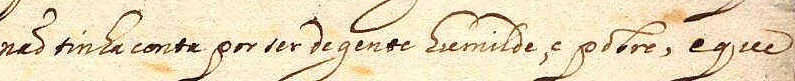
naõ tinha conta por ser de gente humilde, e pobre, e que
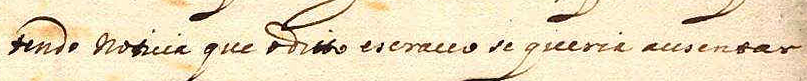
tendo noticia que o ditto escrauo se queria ausentar
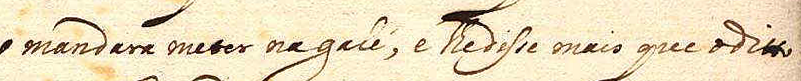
o mandara meter na galé, e lhe disse mais que o ditto
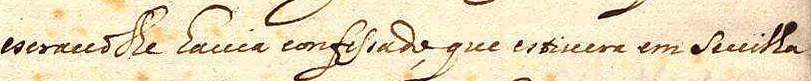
escrauo lhe hauia confessado, que estiuera em Seuilha
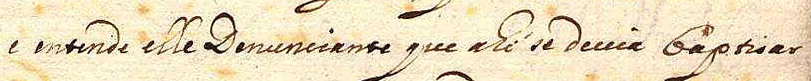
e entende elle Denunciante que ahi se deuia baptisar
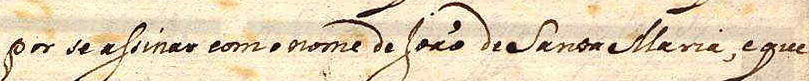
por se assinar com o nome de Joaõ de Santa Maria, e que
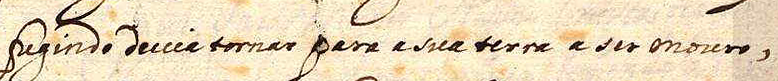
fugindo deuia tornar para a sua terra a ser mouro,
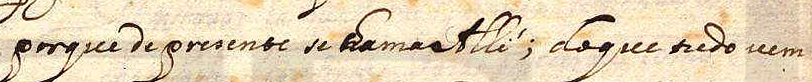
porque de presente se chama Alli; do que tudo uem
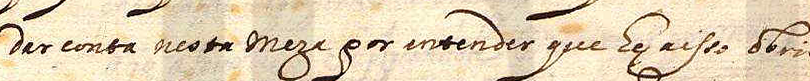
dar conta nesta meza por entender que he a isso obri
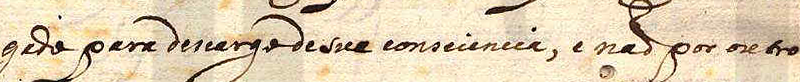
gado para descargo de sua consciencia, e naõ por outro
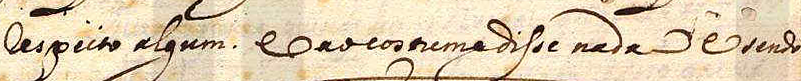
Respeito algum. E ao costume disse nada – e sendo
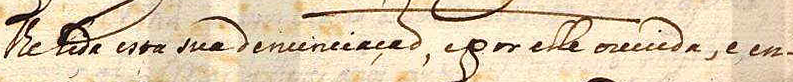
lhe lida esta sua denunciaçaõ, e por elle ouuida, e en
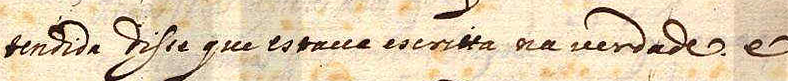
tendida disse que estaua escritta na uerdade e
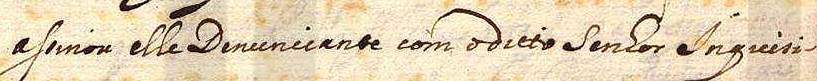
assinou elle Denunciante com o ditto Senhor Inquisi
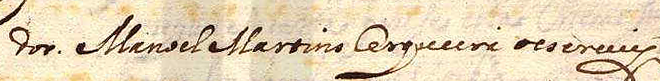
dor. Manoel Martins Cerqueira o escreuj
